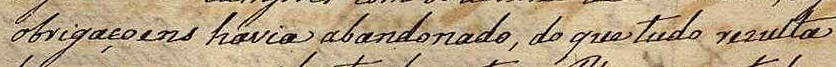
obrigaçoens havia abandonado, do que tudo rezulta
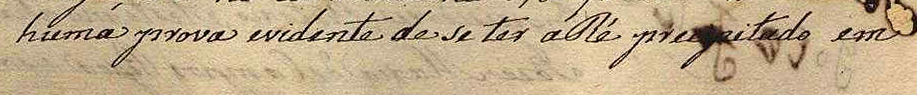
huma prova evidente de se ter a Ré precipitado em
